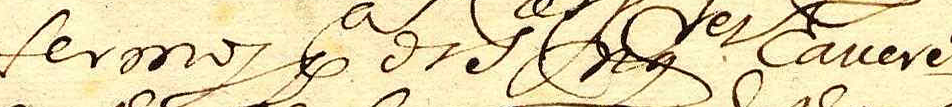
termos pa os S.res Inqres hauerē
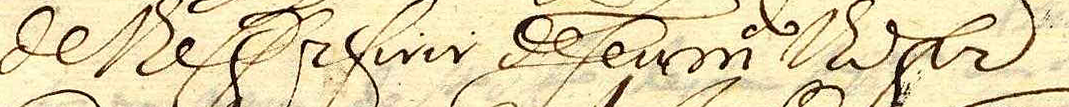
delhe Defirir de seu mdo lhe fiz
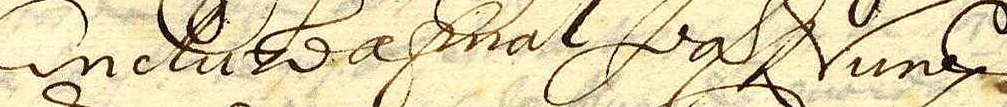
Concluzo afinal Joaõ Nunes
